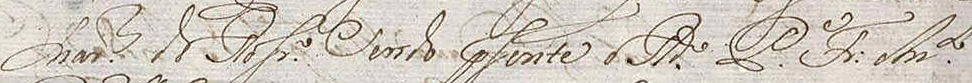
Snar.r do Rosr.o Sendo p̄sente o Rd.o P.e Fr: An.to
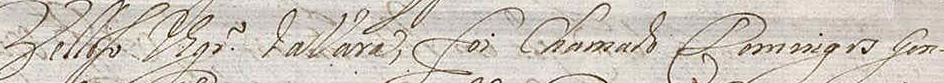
Velloso Vigr.o da Vara, foi Chamado Domnigos Gon
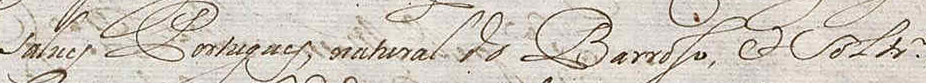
salves Portugues, natural do Barroso, et soltr.o
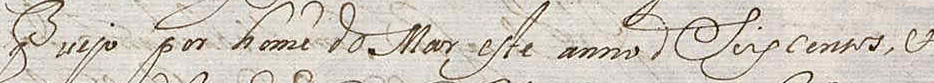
q̄ vejo por homē do Mar este anno d Seiscentos, et
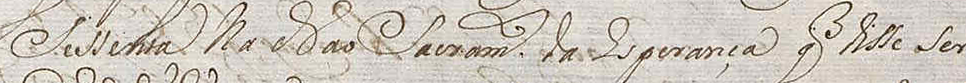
Sessenta na Nao Sacram.to da Esperança q̄ disse ser
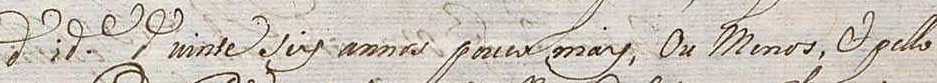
a id.e d vinte seis annos pouco mais, ou Menos, E pello
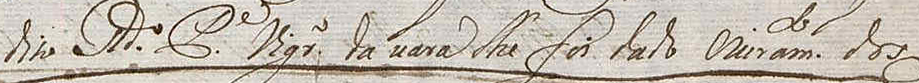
dito Rd.o P.e Vigr.o da vara lhe foi dado o iuram.to dos
